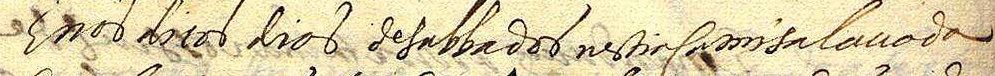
E nos ditos dias de sabbados uestia Camisa lauada
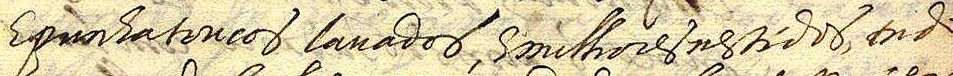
E punha toucas lauadas, E milhores uestidos, tudo
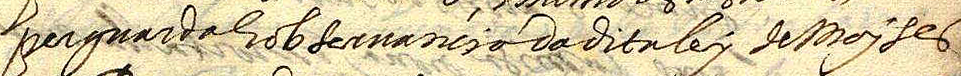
per guarda E obseruancia da dita ley de Moyses
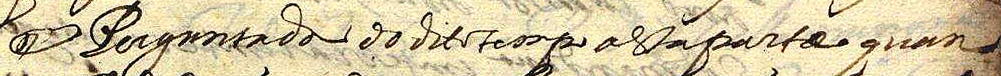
⁋ Perguntada do dito tempo a esta parte quan
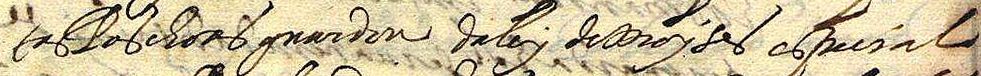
tas Paschoas guardou da ley de moyses especial
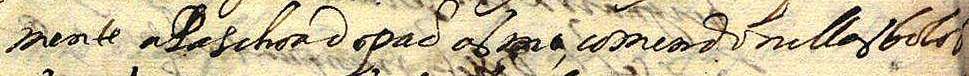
mente a Paschoa do paõ asmo, comendo nellas bolos
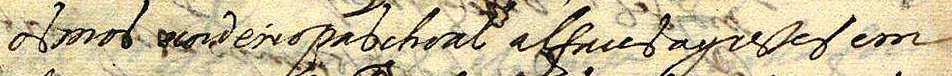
asmos e cordeiro paschoal alfaçes agrestes em
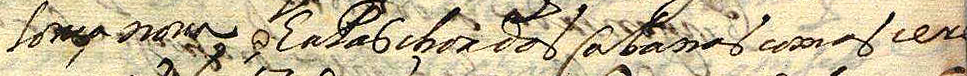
louça noua, E a Paschoa das Cabanas com as cere
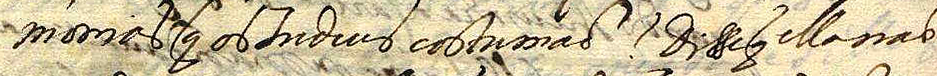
monias q̄ os Iudeus costumaõ? Disse q̄ ella naõ
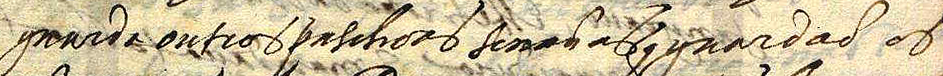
guarda outras paschoas senaõ as q̄ guardaõ os
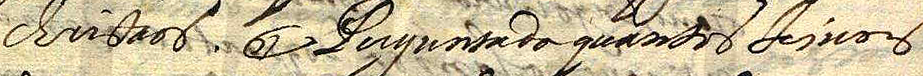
christaos. ⁋ Perguntada quantos Jeiuns
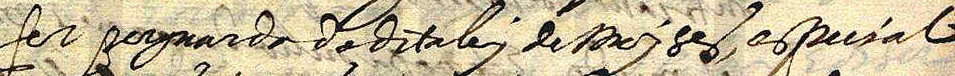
fez per guarda da dita ley de moyses, especial
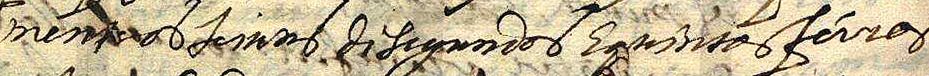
mente os Jeiuns de segundas E quintas feiras
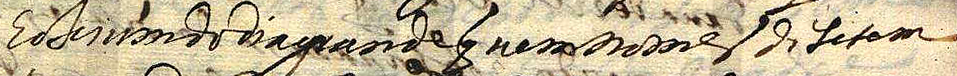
E o Jeium do dia grande q̄ uem no mes de setem
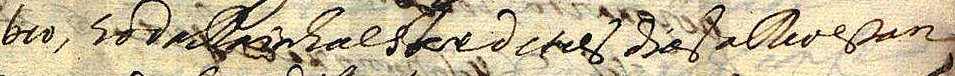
bro, E o da Rainha ester de tres dias o Reo estan
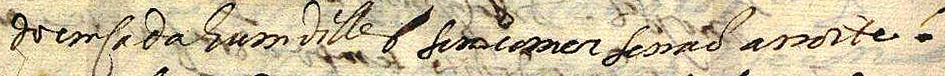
do em Cada hum delles sem comer senaõ a noite?
